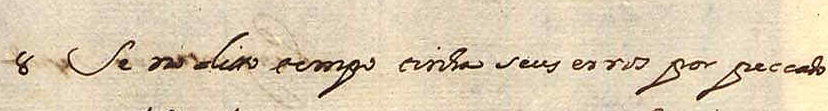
8 Se no ditto tempo tinha seus erros por peccado
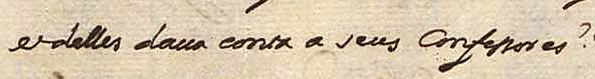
e delles daua conta a seus Confessores?
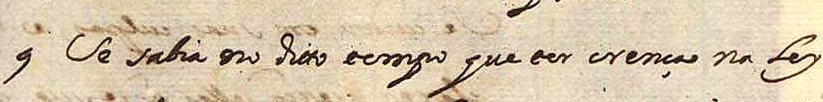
9 Se sabia no ditto tempo que ter crença na Ley
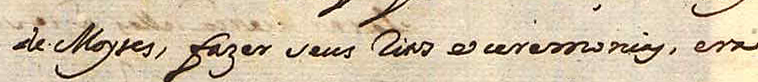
de Moyses, fazer seus Ritos e ceremonias, era
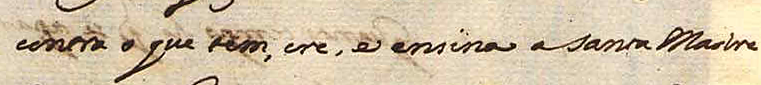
contra o que tem, cre, e ensina a santa Madre
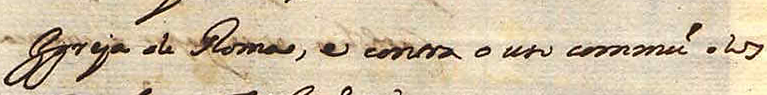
Jgreja de Roma, e contra o uso commū dos
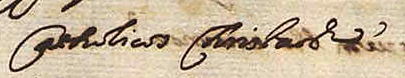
Catholicos Christaos̄?
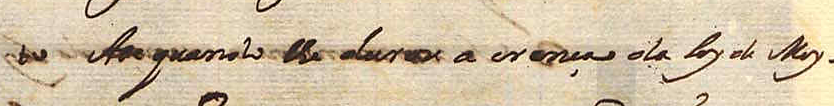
10 Ate quando lhe durou a crença da ley de Moy
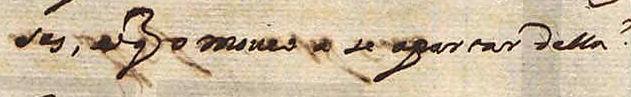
ses, ao q̄ o moueo a se apartar della?
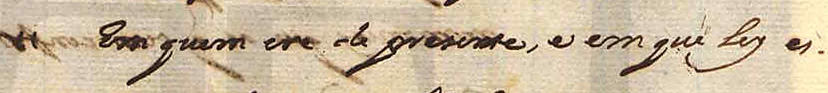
11 Em quem cre de presente, e em que ley es
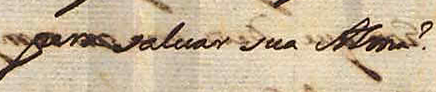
pera saluar sua Alma?
